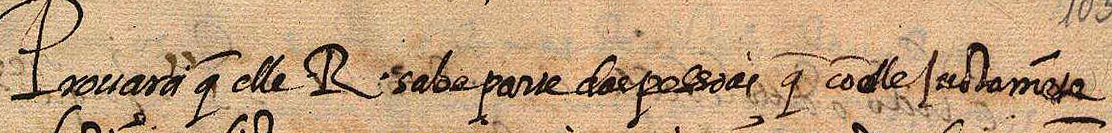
Prouara q̄ elle R. sabe parte das pessoas q̄ cō elle Juctamēte
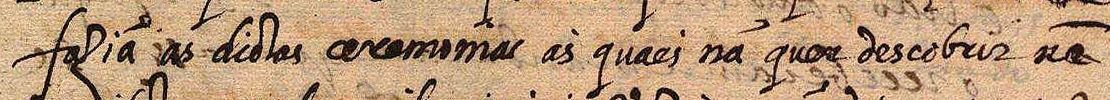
faziā as dictas ceremonias as quaes nā quer descobrir nē
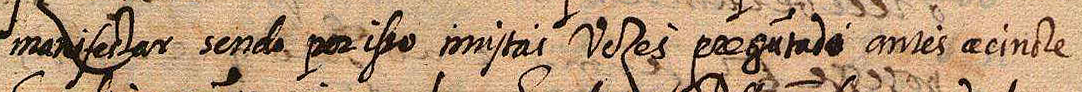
manifestar sendo por isso mujtas vezes pregūtado antes acincte
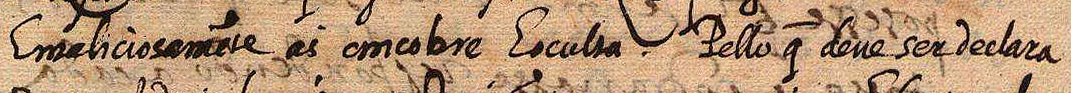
E maliciosamēte as emcobre E oculta. Pello q̄ deue ser declara
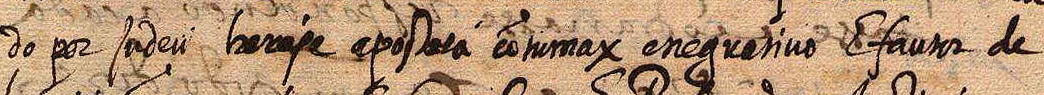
do por Judeu hereje apostata cōtumax e negratiuo E fautor de
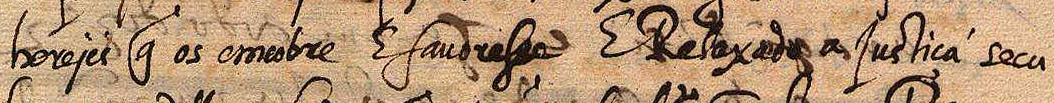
herejes q̄ os emcobre E fauoresse E Relaxado a Justiça secu
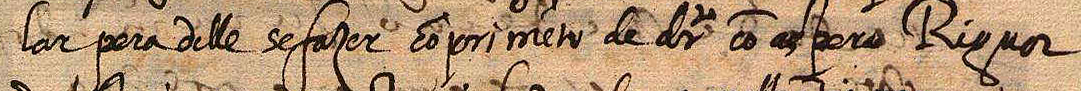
lar pera delle se fazer cōprimēto de drto cō aspero Riguor
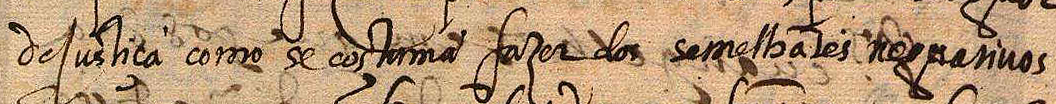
de Justiça como se costuma fazer dos semelhātes negratiuos
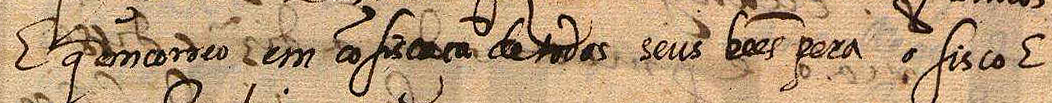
E q̄ encorreo em cōfiscaçā de todos seus beēs pera o fisco E
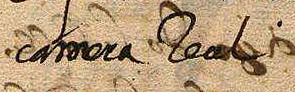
camera Real
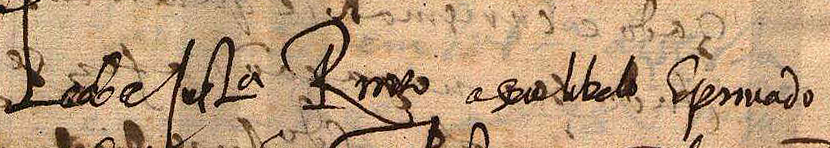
Pede a Justa Rmto a seu libelo E prouado
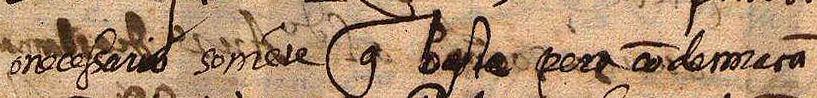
o necessario somēte q̄ baste pera cōdemnaçā
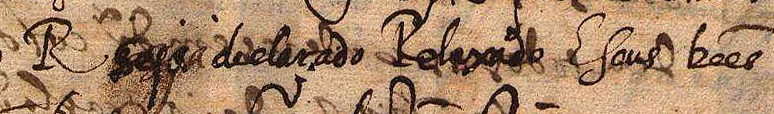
o R seja declarado Relaxado E seus beēs
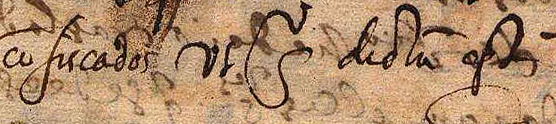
cōfiscados vt s̄ dictū est
